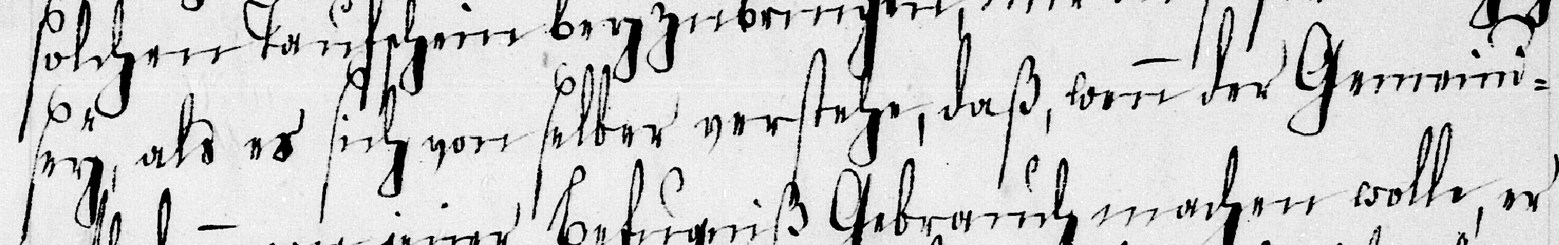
sey, als es sich von selber verstehe, daß, wenn der Gemeind¬
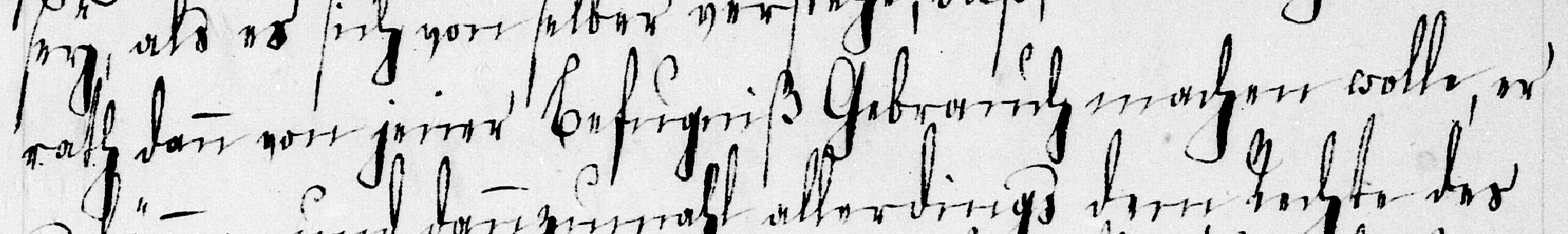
rath dann von jener Befugniß Gebrauch machen wolle, er
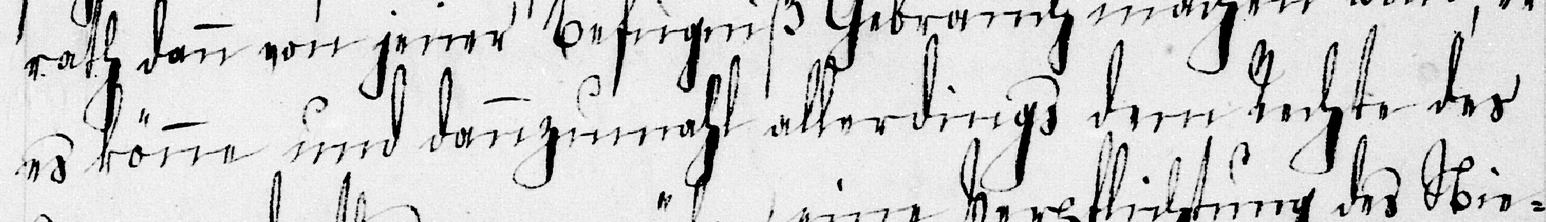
es könne und dannzumahl allerdings dem Rechte des
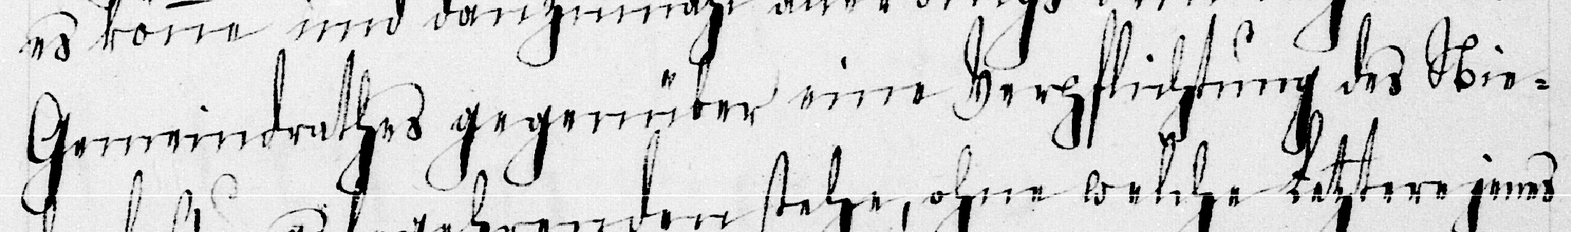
Gemeindrathes gegenüber eine Verpflichtung des Nie¬
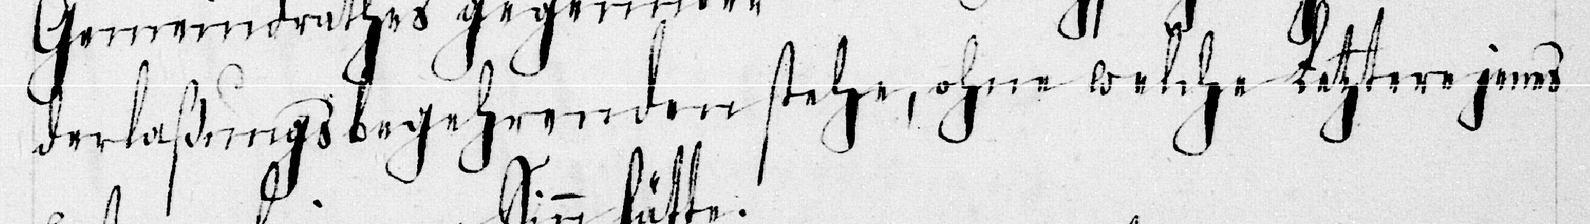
derlaßungsbegehrenden stehe, ohne welche Letztere jenes
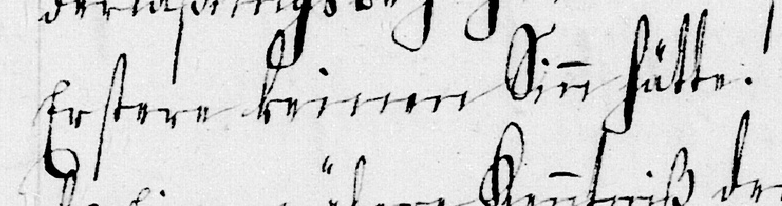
Erstere keinen Sinn hätte.
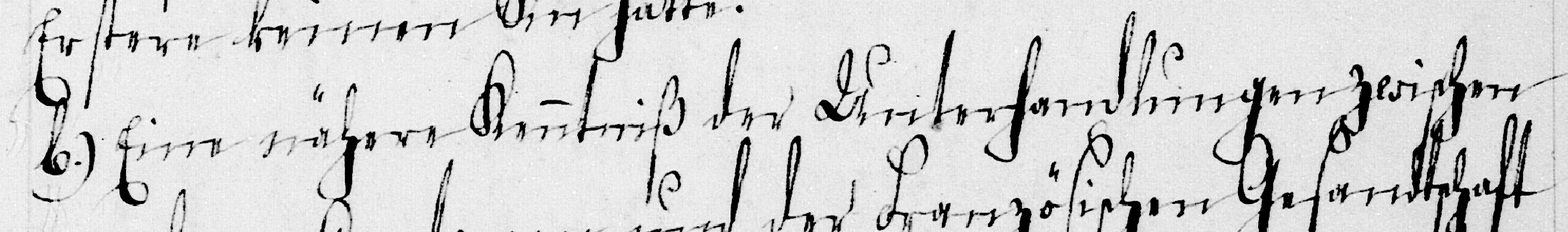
b.) Eine nähere Kenntniß der Unterhandlungen zwischen
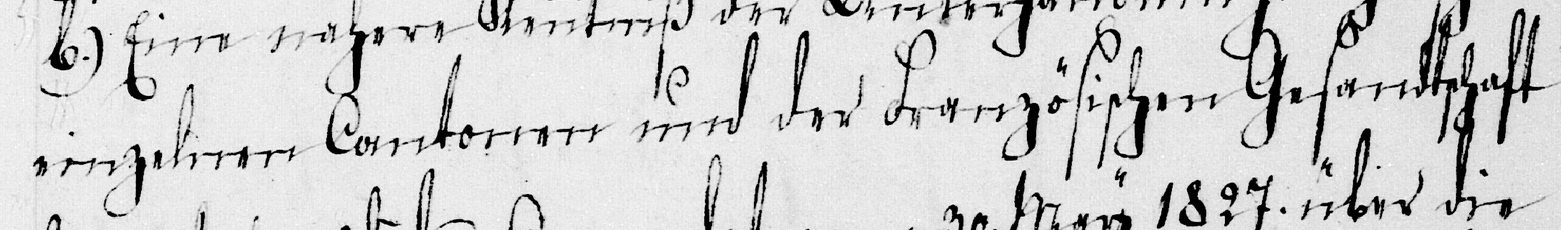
einzelnen Cantonen und der Französischen Gesandtschaft
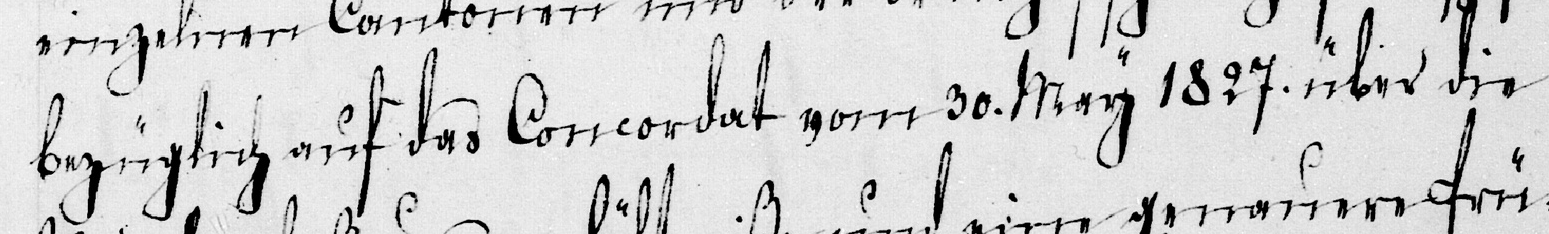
bezüglich auf das Concordat vom 30. März 1827. über die
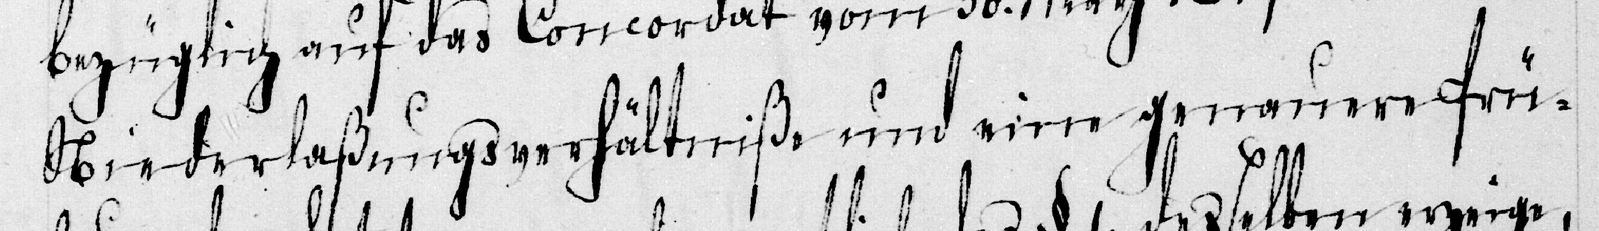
Niederlaßungsverhältniße und eine genaue Prü¬
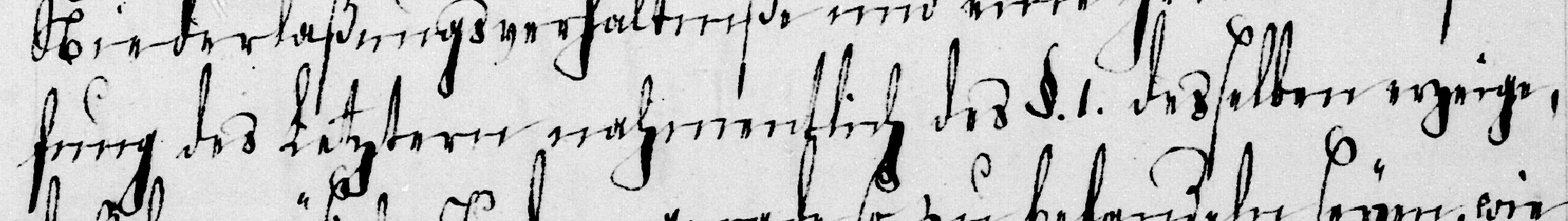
fung des Letztern nahmentlich des §. 1. desselben erzeige,
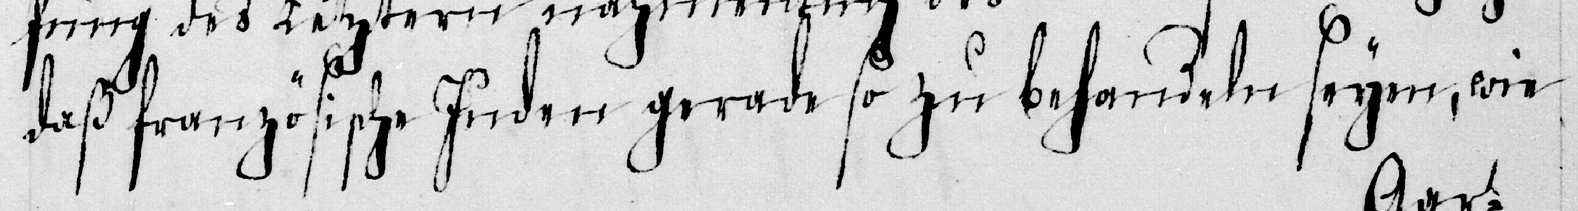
daß französische Juden gerade so zu behandeln seyen, wie
